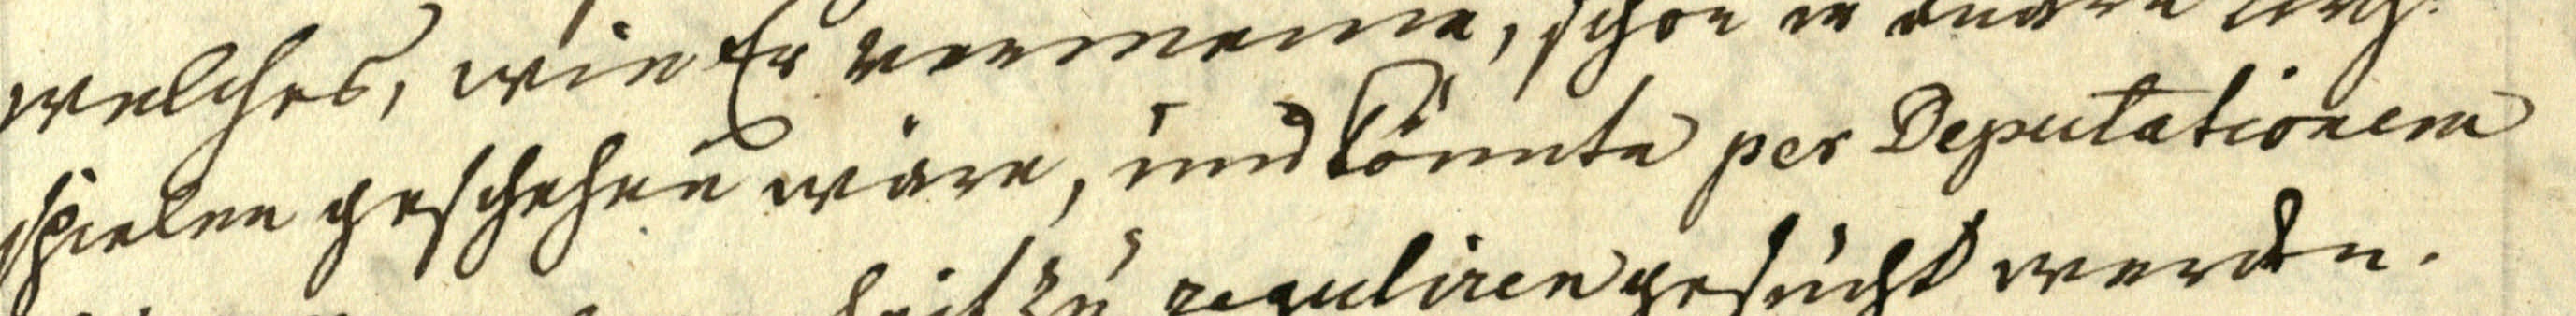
spielen geschehen wäre, und könnte per Deputationem
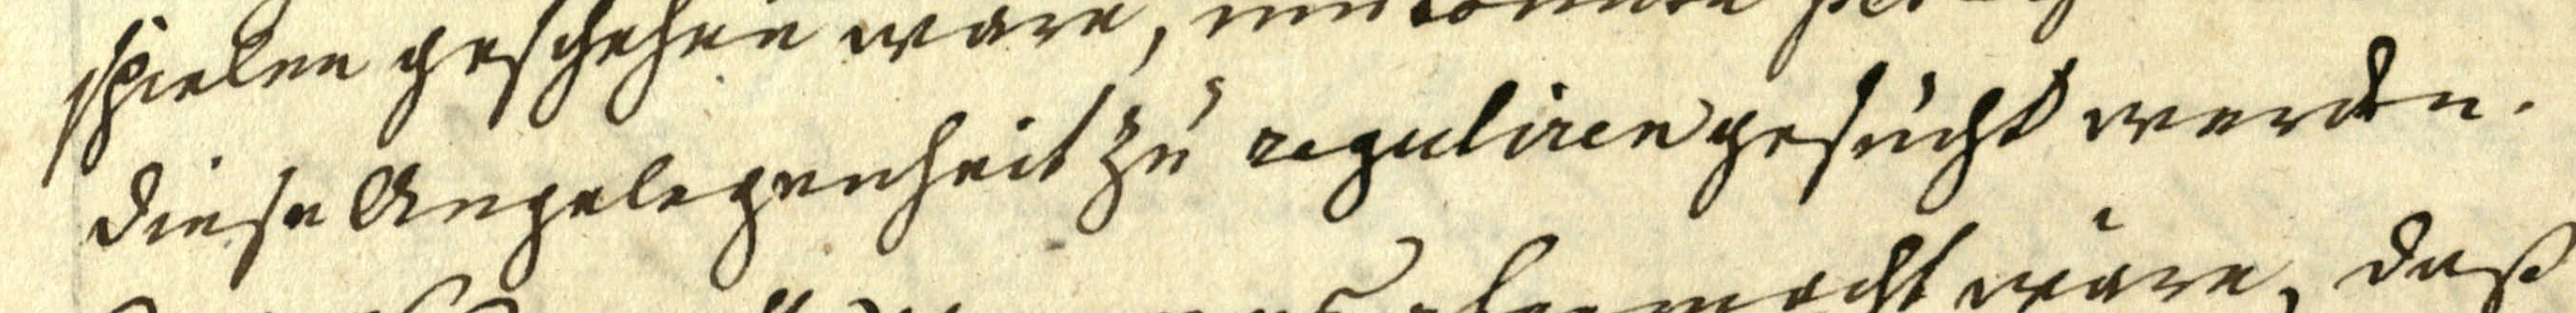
diese Angelegenheit zu reguliren gesucht werden.
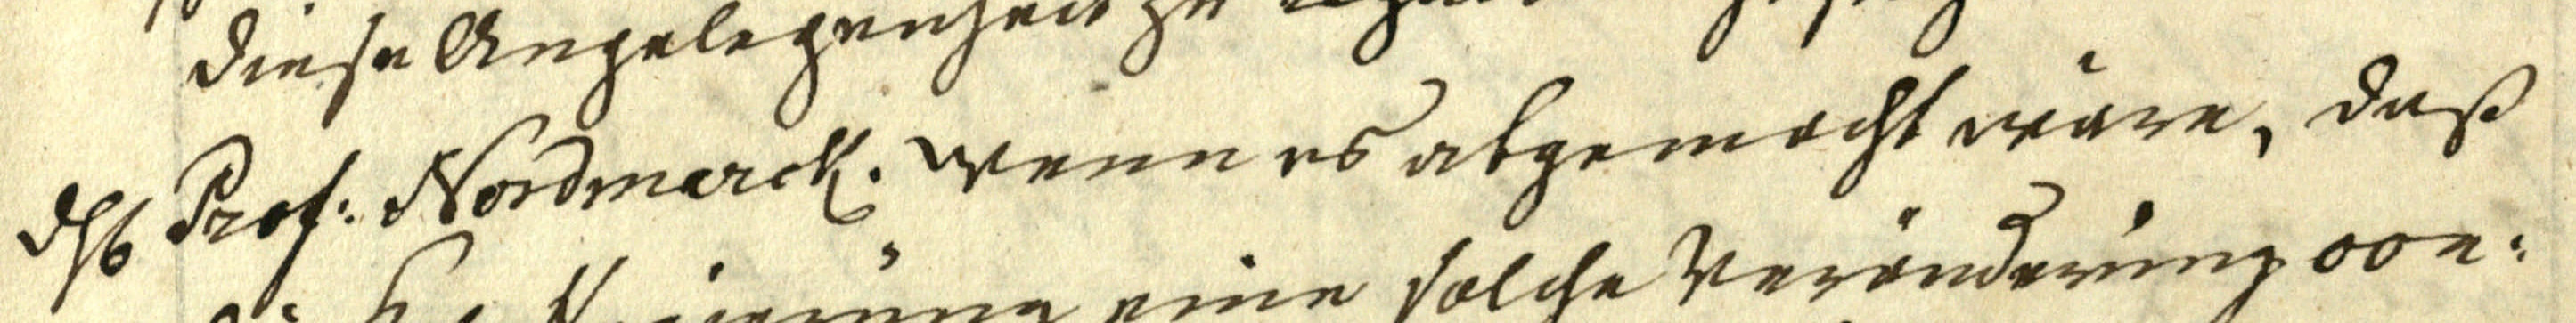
dh Prof. Nordmarck. Wenn es abgemacht wäre, daß
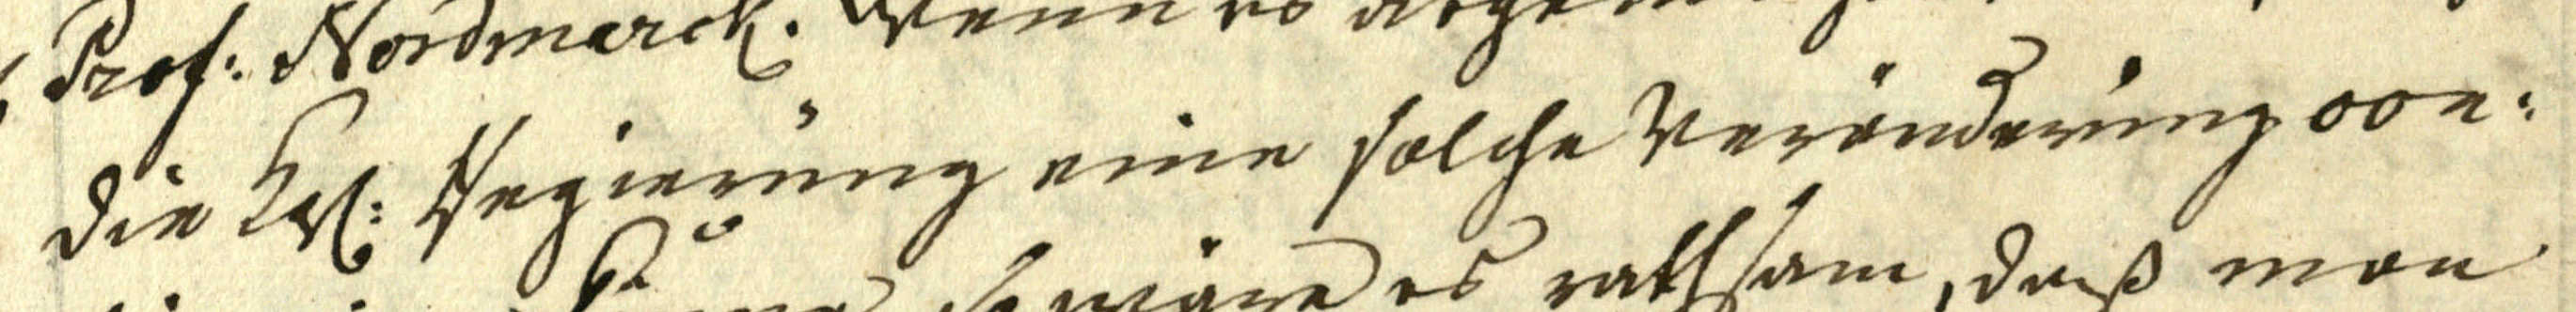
die Kgl. Regierung eine solche Veränderung con¬
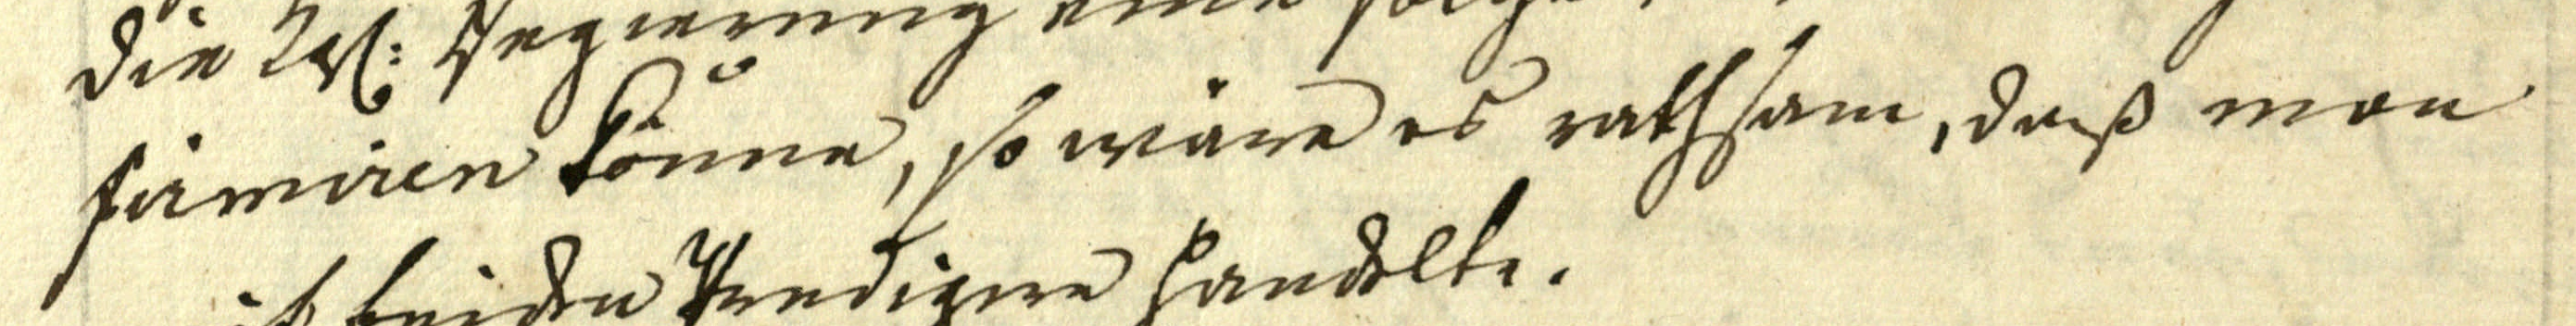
firmiren könne, so wäre es rathsam, daß man
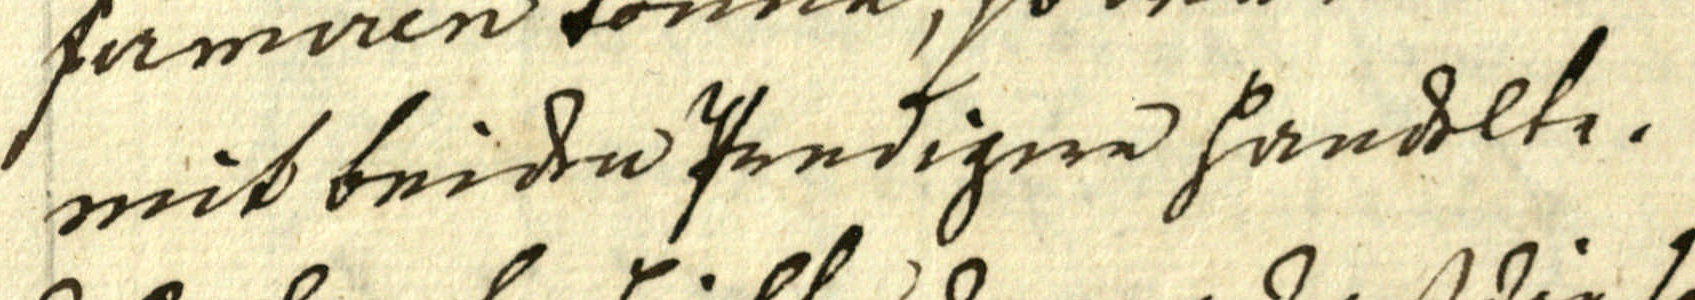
mit beiden Predigern handelte.
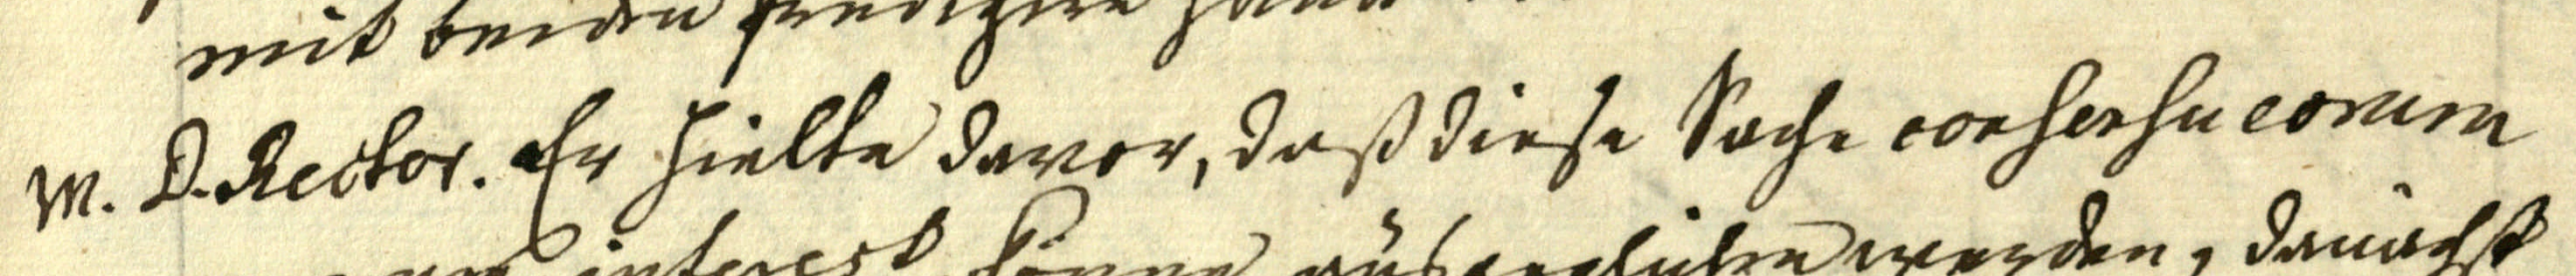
M. D. Rector. Er hielte davor, daß diese Sache consessueorum
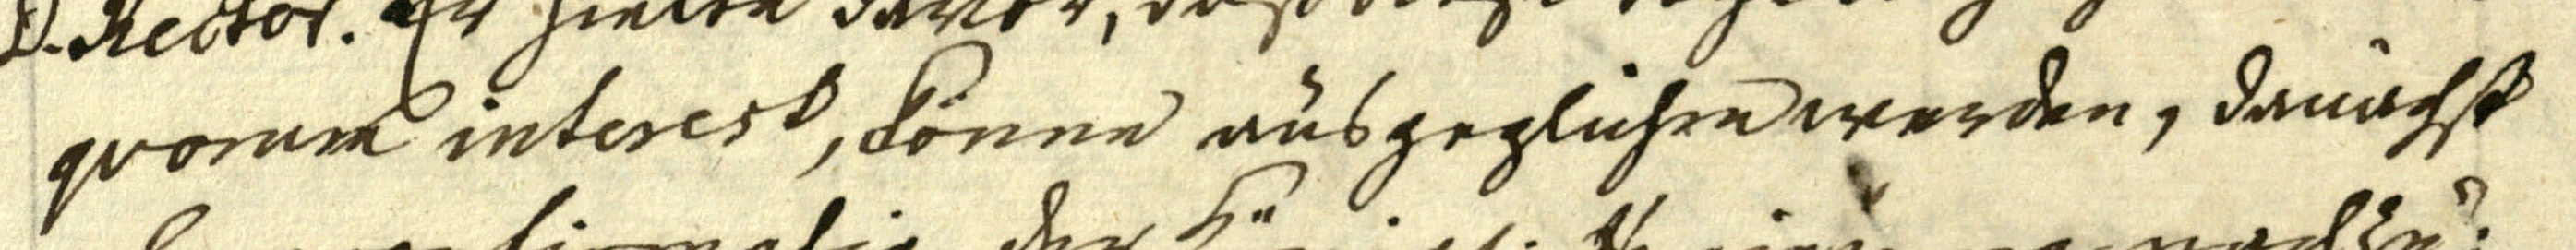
quorum interest, könne ausgeglichen werden, danächst
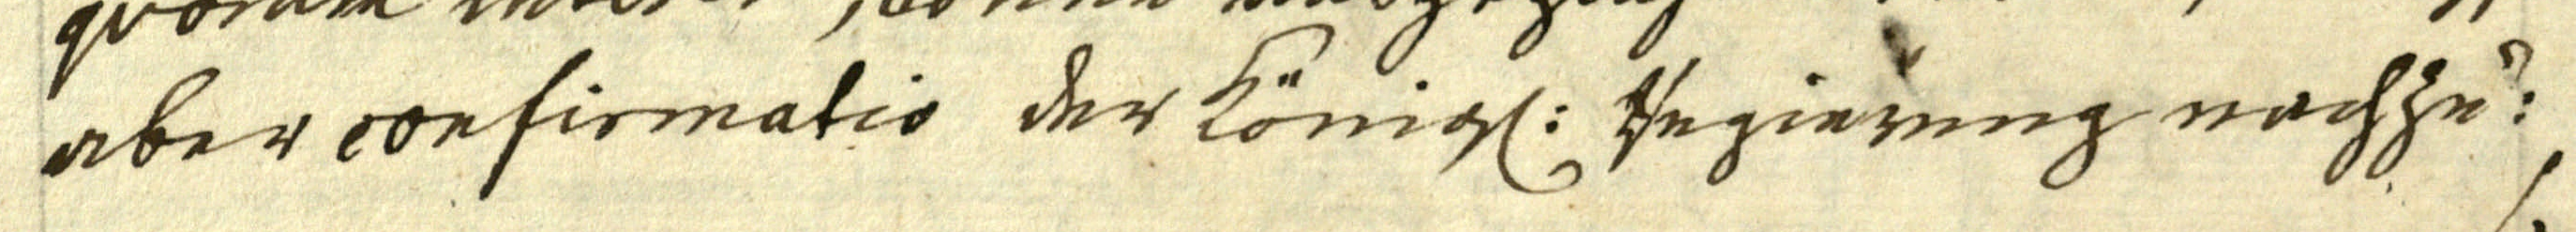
aber confirmatio der Königl. Regierung nach zu¬
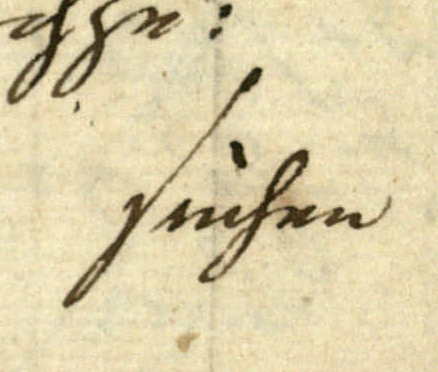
suchen
